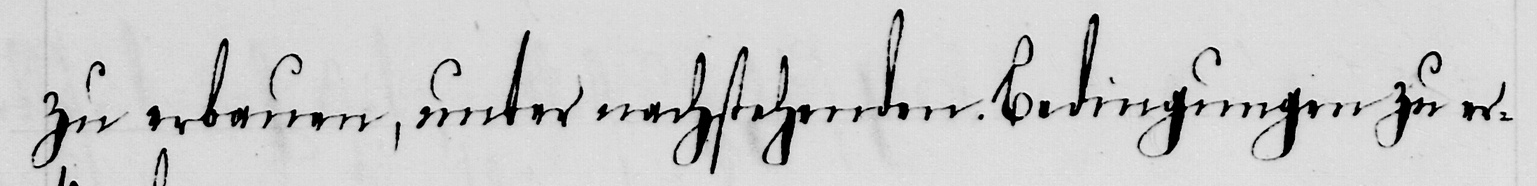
zu erbauen, unter nachstehenden Bedingungen zu er¬
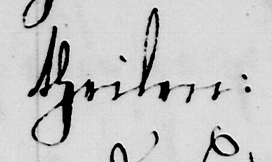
theilen:
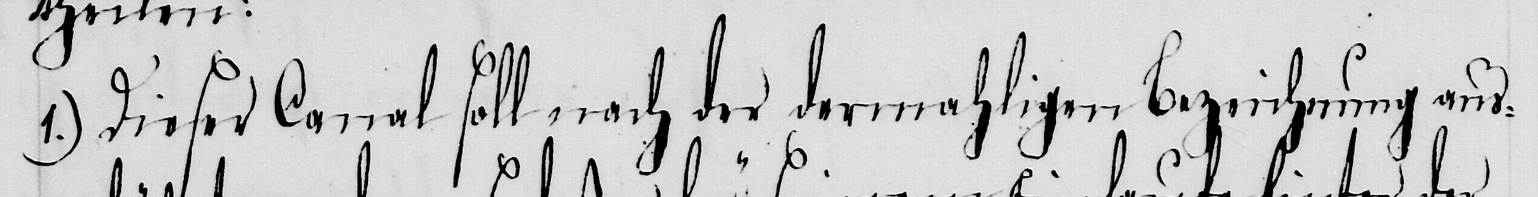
1.) Dieser Canal soll nach der dermahligen Bezeichnung aus¬
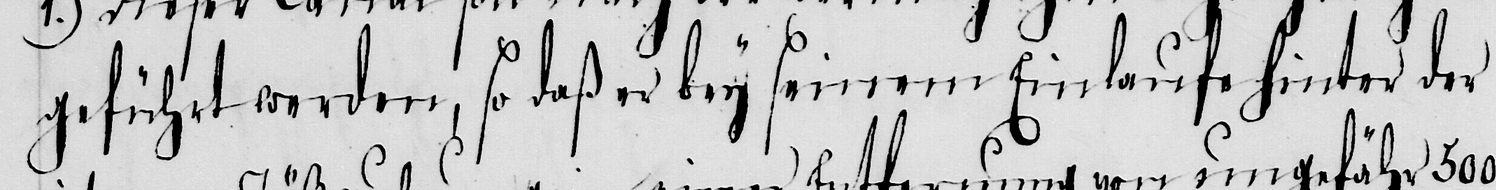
geführt werden, so daß er bey seinem Einlaufe hinter der
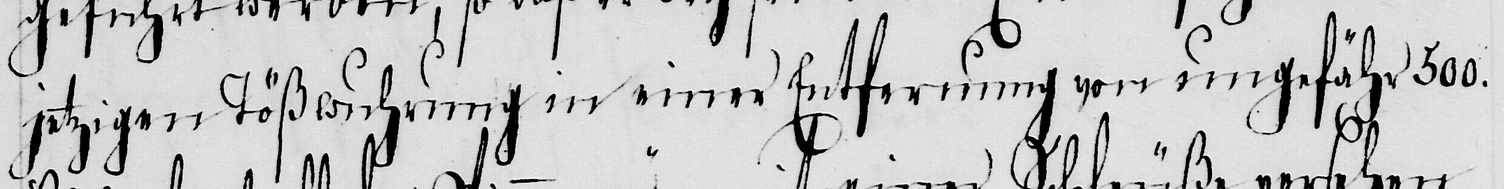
jetzigen Tößwuhrung in einer Entfernung von ungefähr 500.
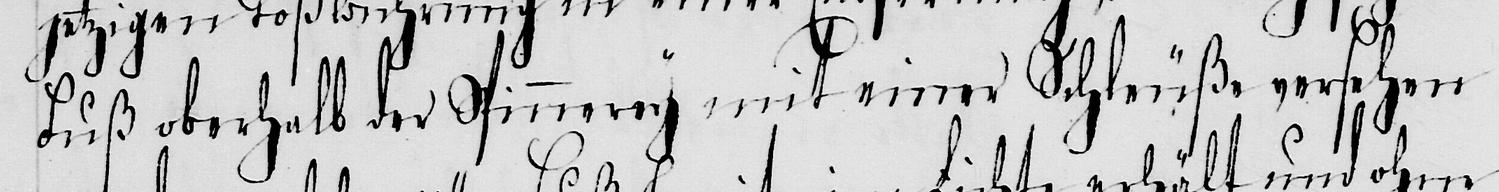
Fuß oberhalb der Spinnerey mit einer Schleuse versehen
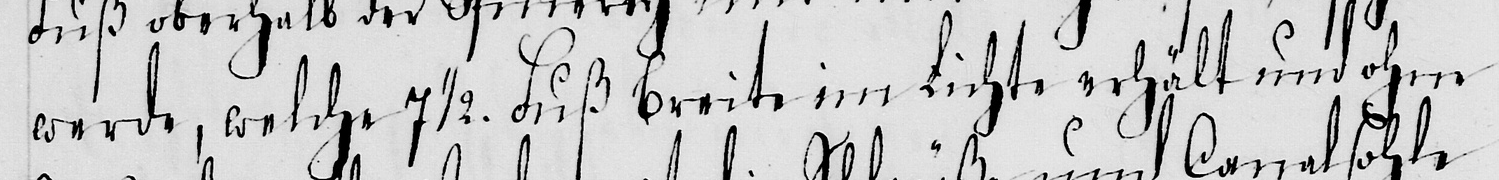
werde, welche 7 1/2. Fuß Breite im Lichte erhält und ohne
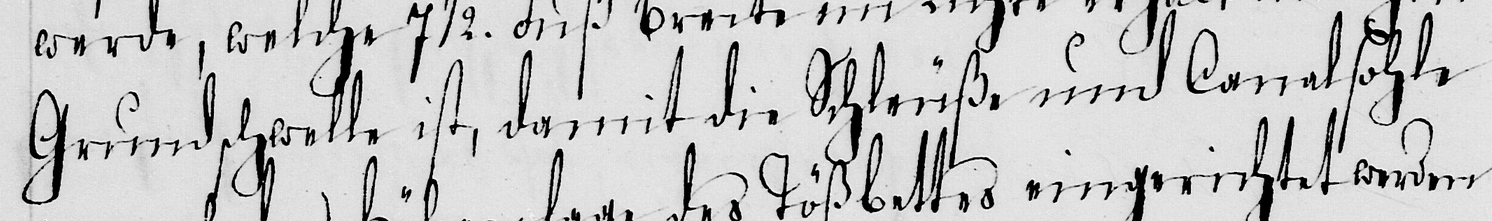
Grundschwelle ist, damit die Schleuße und Canalsohle
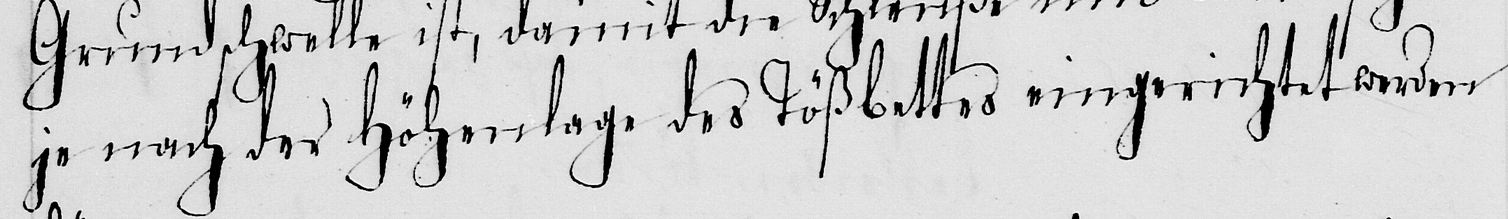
je nach der Höhenlage des Tößbettes eingerichtet werden
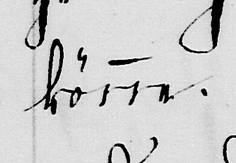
könne.
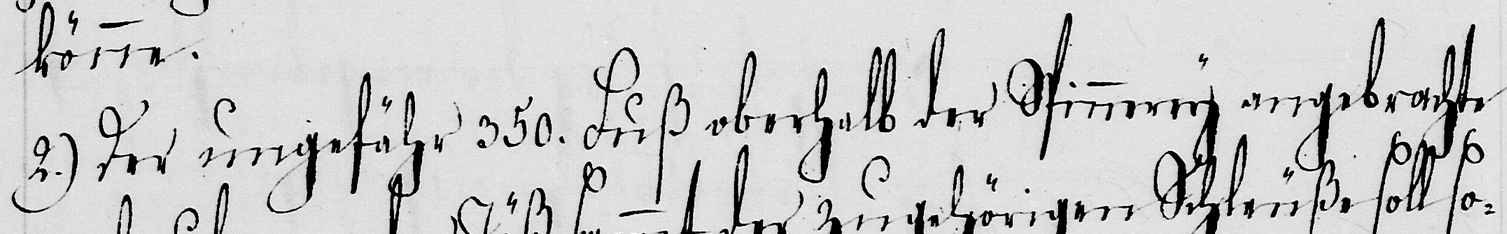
2.) Der ungefähr 350. Fuß oberhalb der Spinnerey angebrachte
